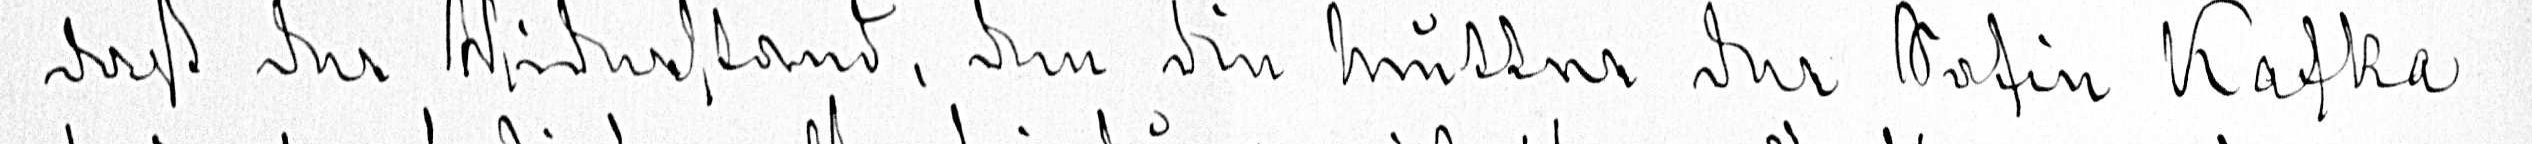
daß der Widerstand, den die Mutter der Sofie Kafka
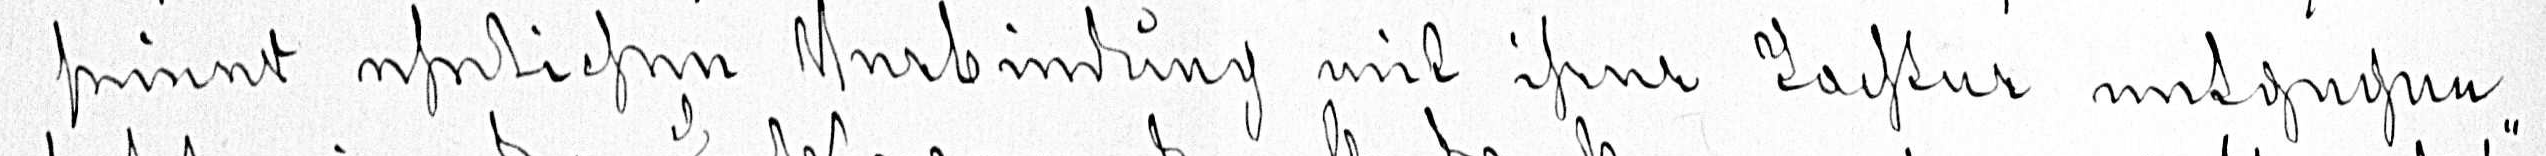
seiner ehelichen Verbindung mit ihrer Tochter entgegen
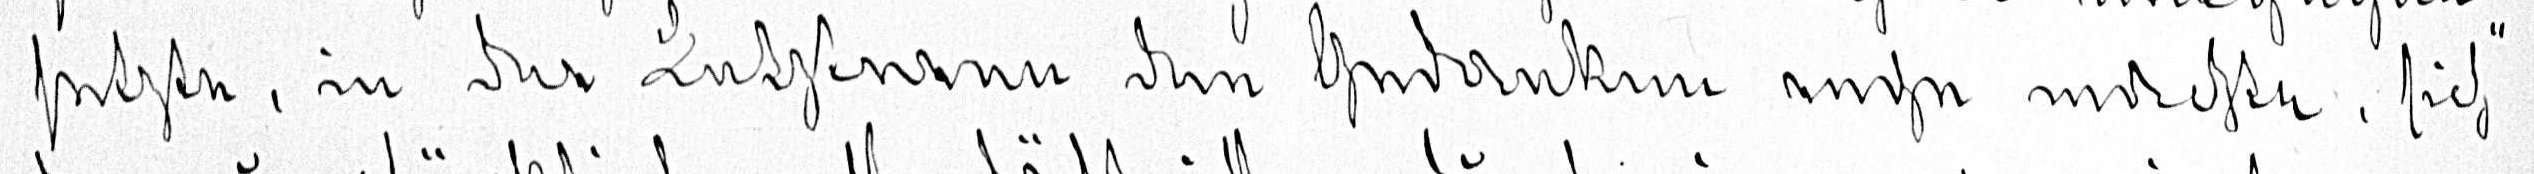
setzte, in der Letzteren den Gedanken rege machte, sich
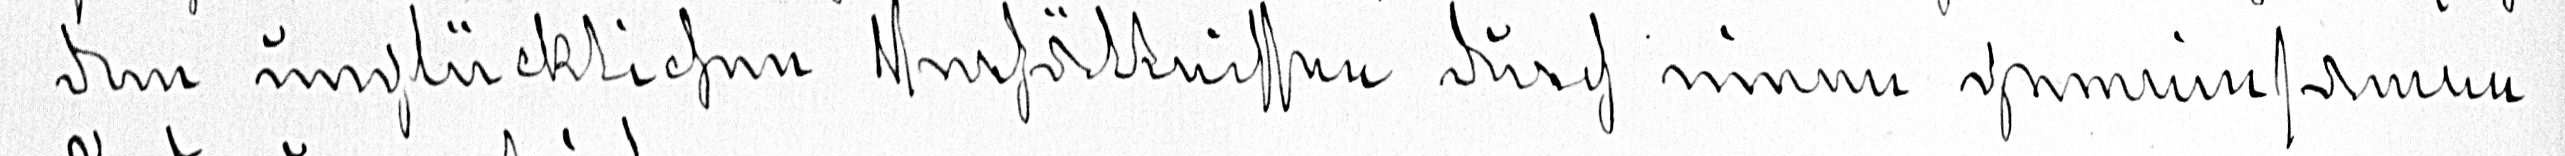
den unglücklichen Verhältnisse durch einen gemeinsamen
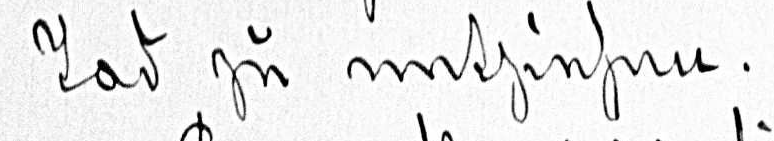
Tod zu entziehen.
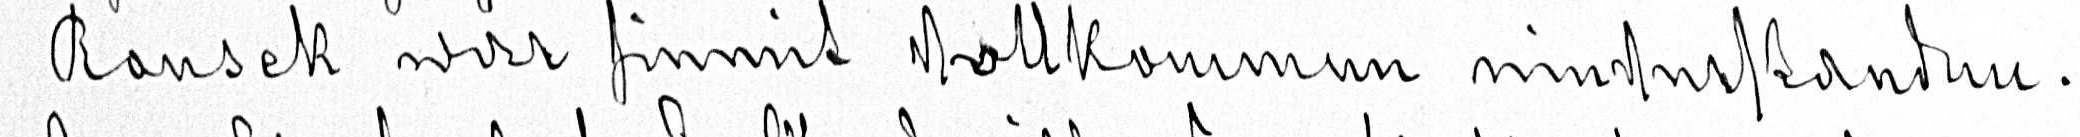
Rousek war hiemit vollkommen einverstanden.
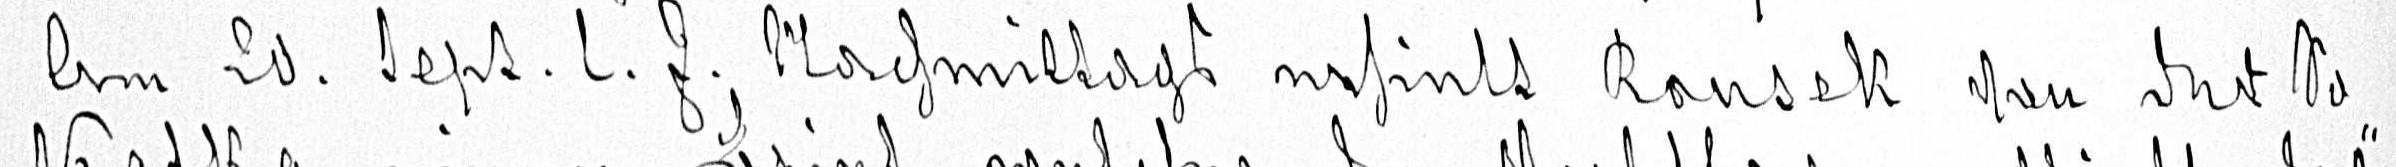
Am 20. Sept. l. Nachmittags erhielt Rousek von der So¬
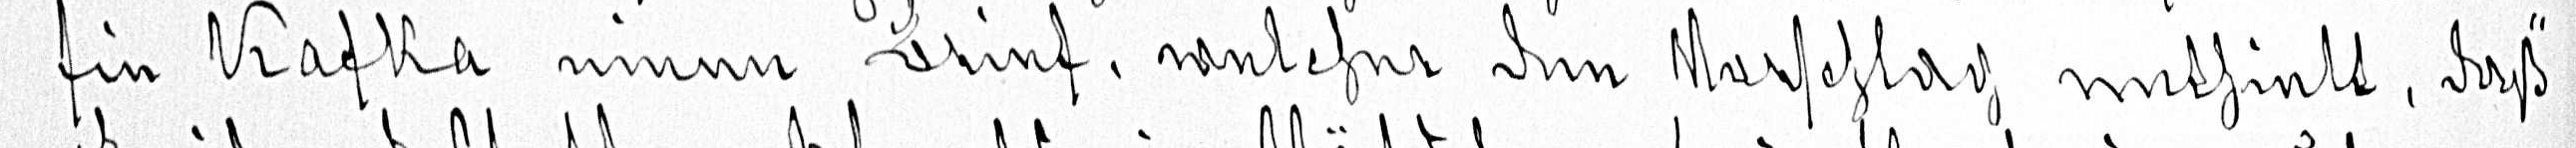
fie Kafka einen Brief, welcher den Vorschlag enthielt, daß
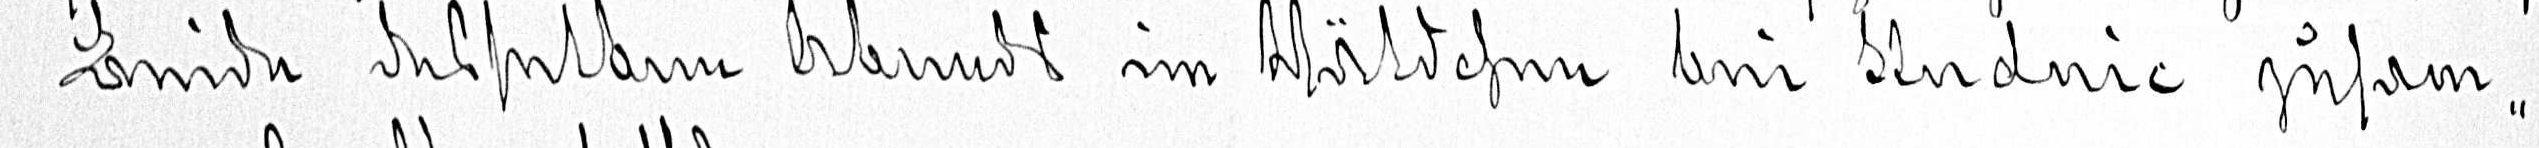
Beide desselben Abends im Wäldchen bei Studnic zusam¬
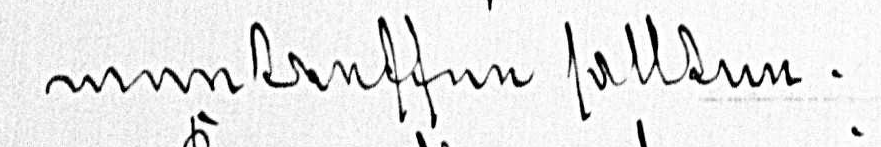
mentreffen sollten:
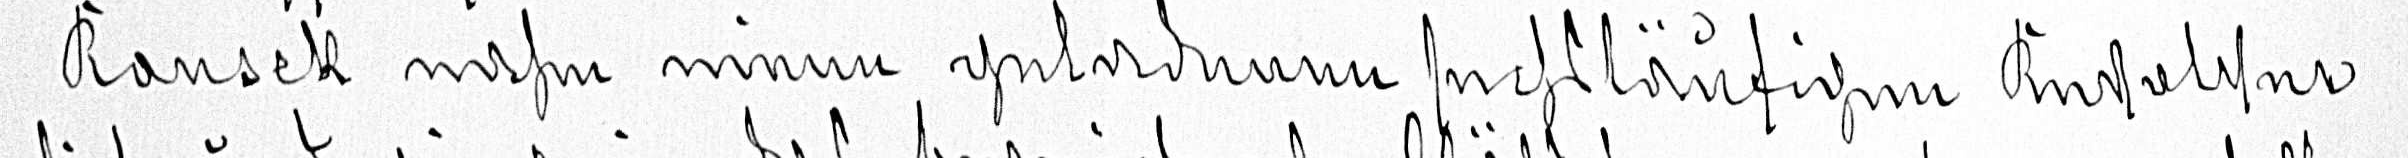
Rousek nahm einen geladenen sechsläufigen Revolver
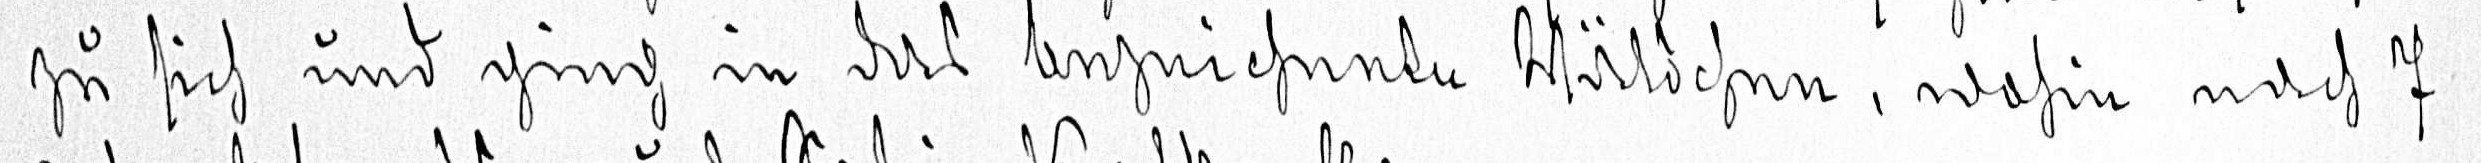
tödten wurde.
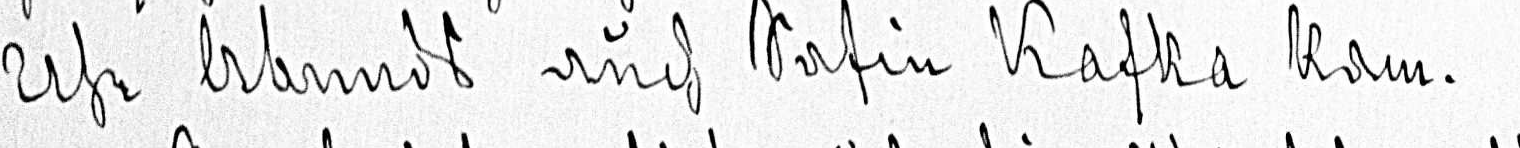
Die bei der Kafka constatirte tödtliche Verletzung
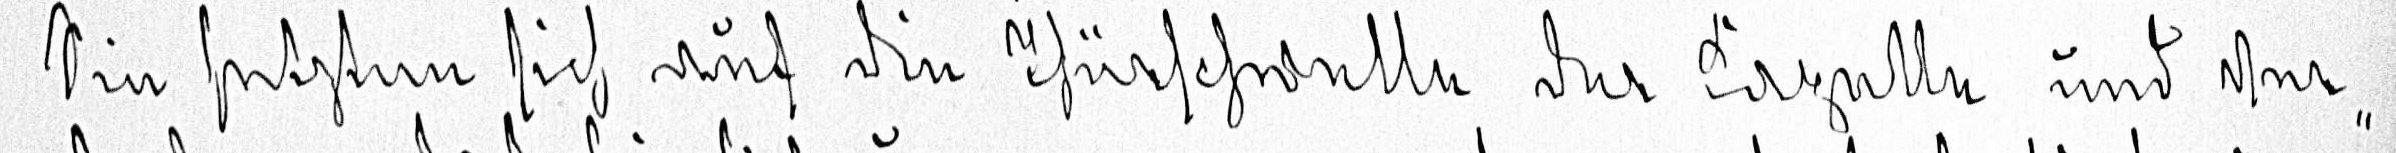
rühre einzig und allein von ihm her; den Schuß selbst habe
